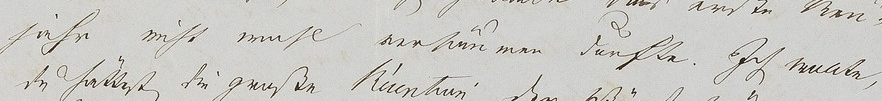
jahr nicht wohl versäumen durfte. Ich wollte,
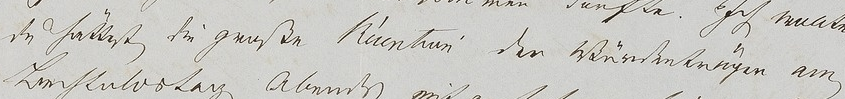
Du hättest die große Réception der Würdenträger am
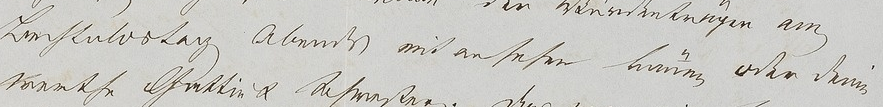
Berchtoldstag Abends mitansehen können oder Deine
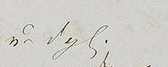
u. dgl.
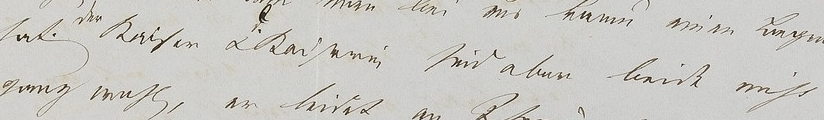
hat. DerKaiser & d.Kaiserin sind aber beide nicht
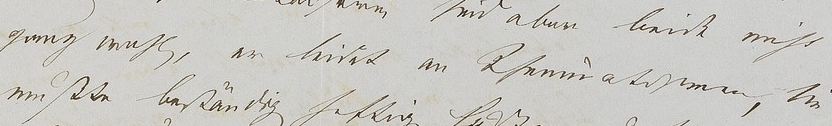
ganz wohl, er leidet an Rheumatissmen, sie
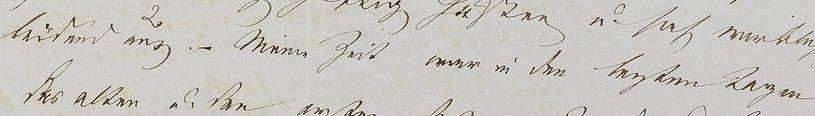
leidend aus. – Meine Zeit war in den lezten Tagen
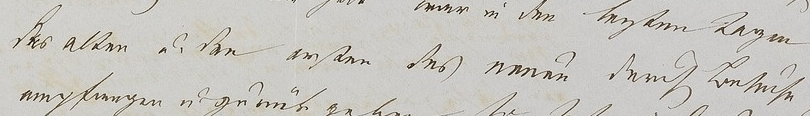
des alten u. den ersten des neuen durch Besuche
